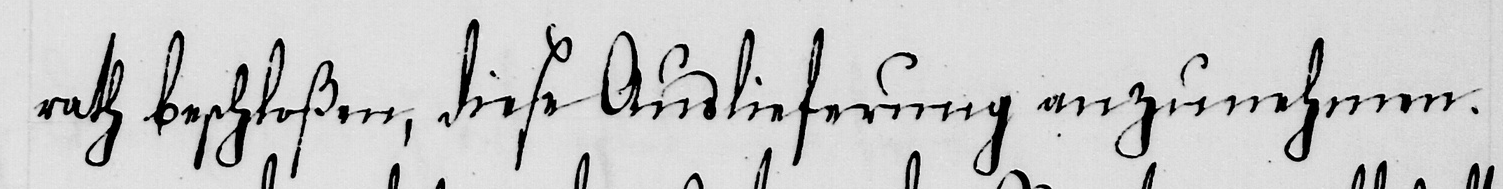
rath beschloßen, diese Auslieferung anzunehmen.
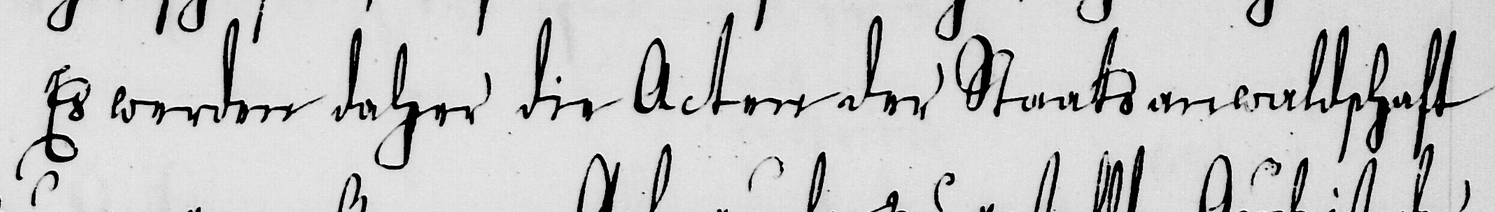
Es werden daher die Acten der Staatsanwaldschaft
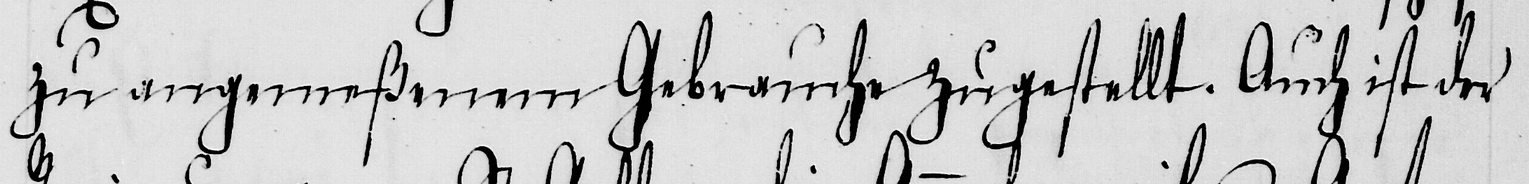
zu angemeßenem Gebrauche zugestellt. Auch ist der
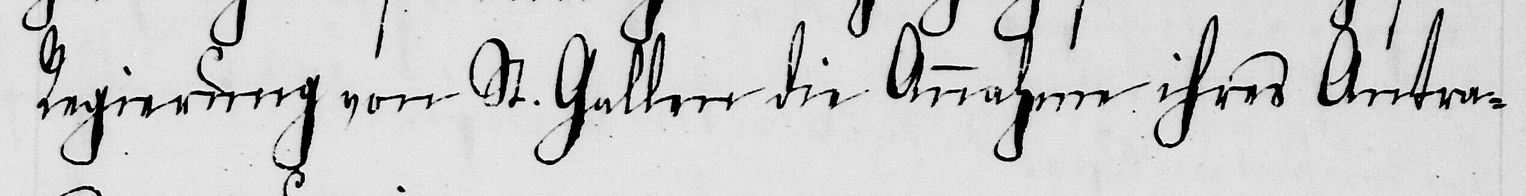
Regierung von St. Gallen die Annahme ihres Antra¬
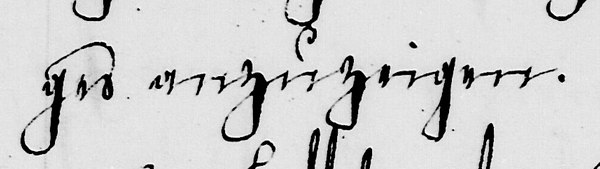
ges anzuzeigen.
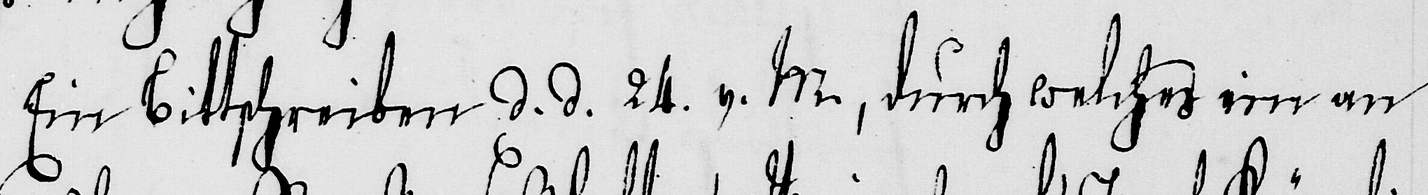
Ein Bittschreiben d. d. 24. v. M., durch welches ein an
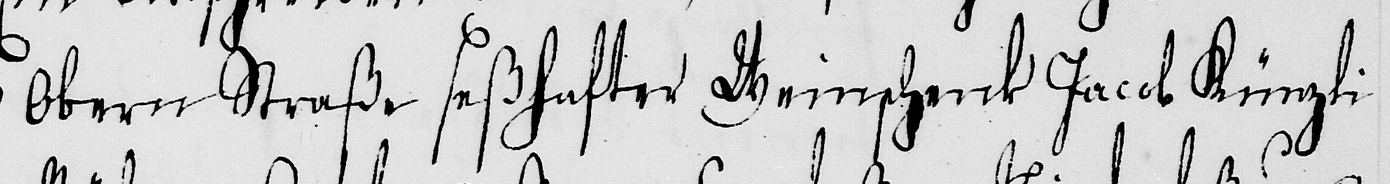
Obern Straße seßhafter Weinschenk Jacob Künzli
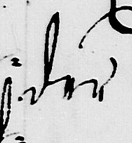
der
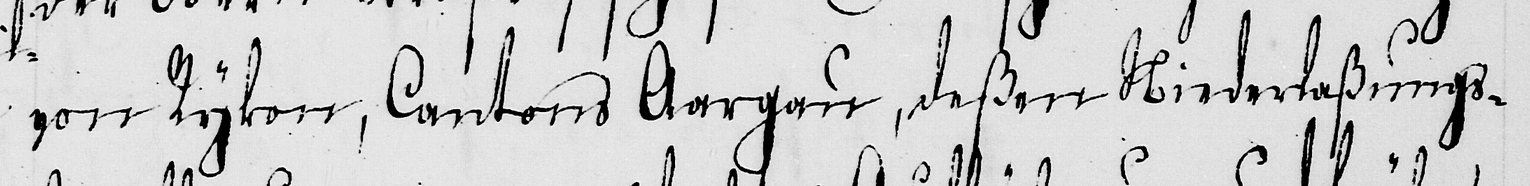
von Rykon, Cantons Aargau, deßen Niederlaßungs¬
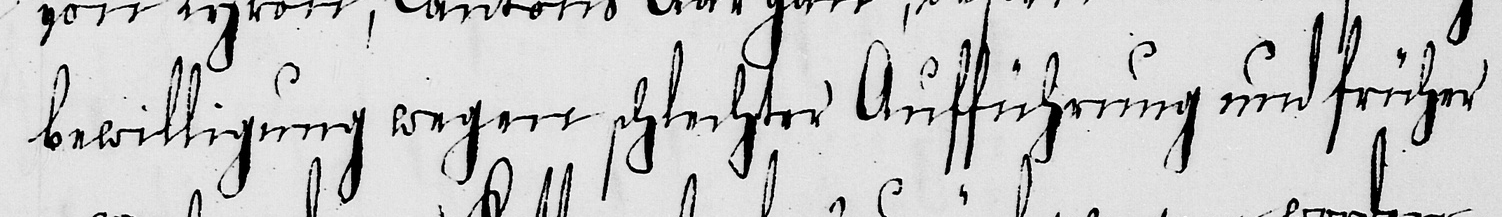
bewilligung wegen schlechter Aufführung und früher
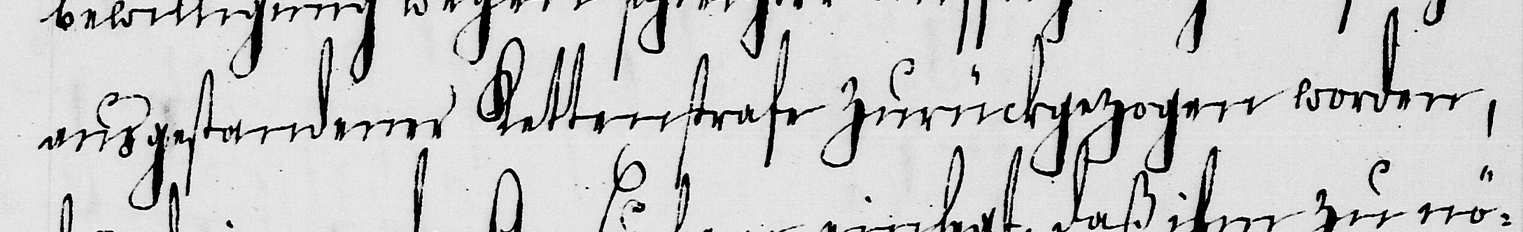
ausgestandener Kettenstrafe zurückgezogen worden,
